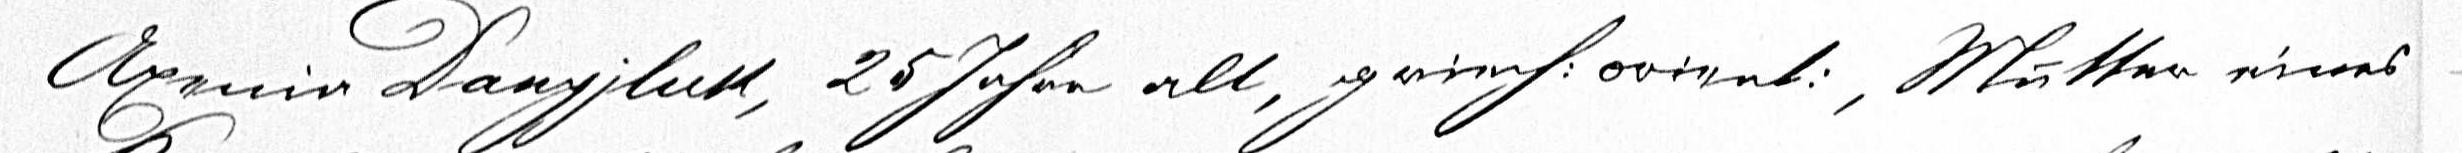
Axenia Danyjluk, 25 Jahre alt, griech. orient. Mutter eines
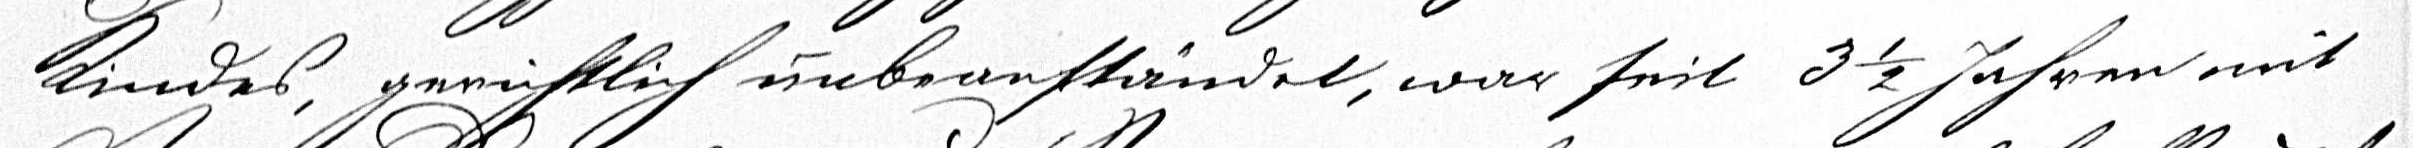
Kindes, gerichtlich unbeanständet, war seit 3 ½ Jahren mit
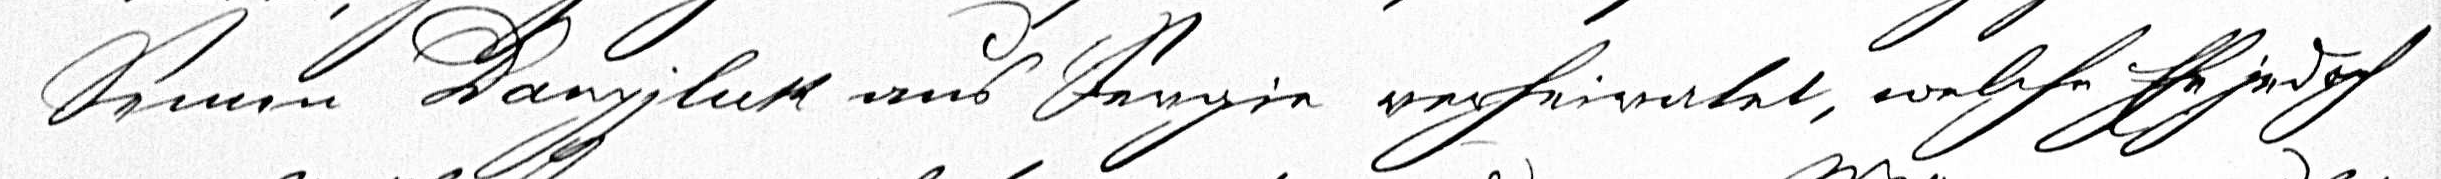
Semen Danyjluk aus Sergie verheiratet, welche Ehe jedoch
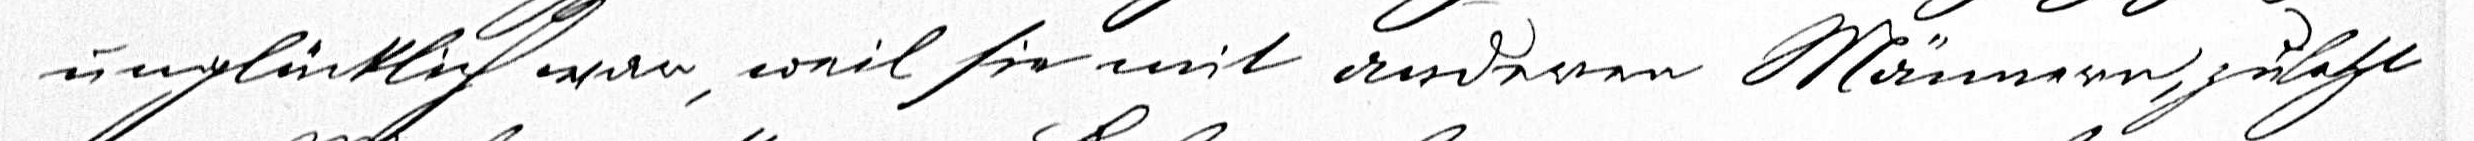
unglücklich war, weil sie mit anderen Männern, zuletzt
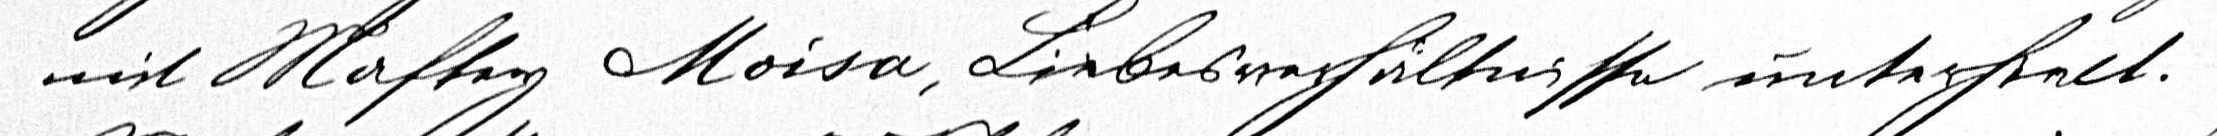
mit Maftey Moisa, Liebesverhältnisse unterhielt.
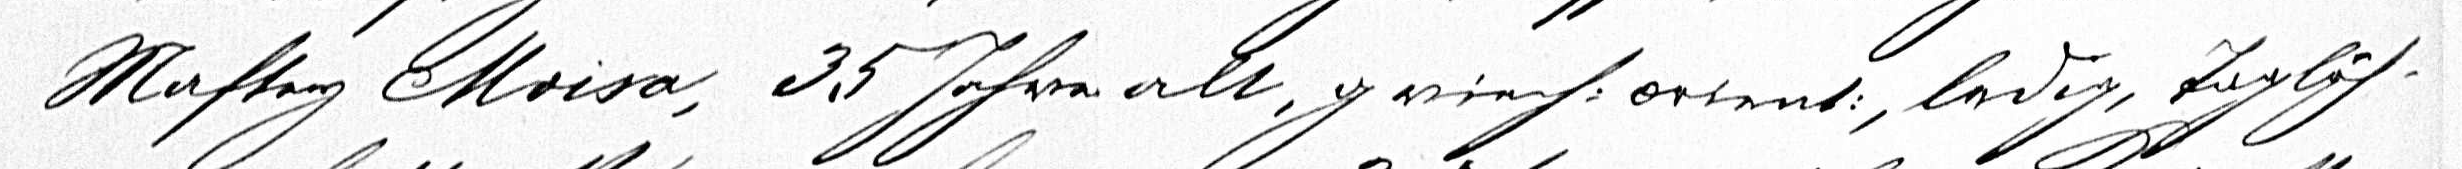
Maftey Moisa, 3.5 Jahre alt, griech. orient., ledig, Taglöh¬
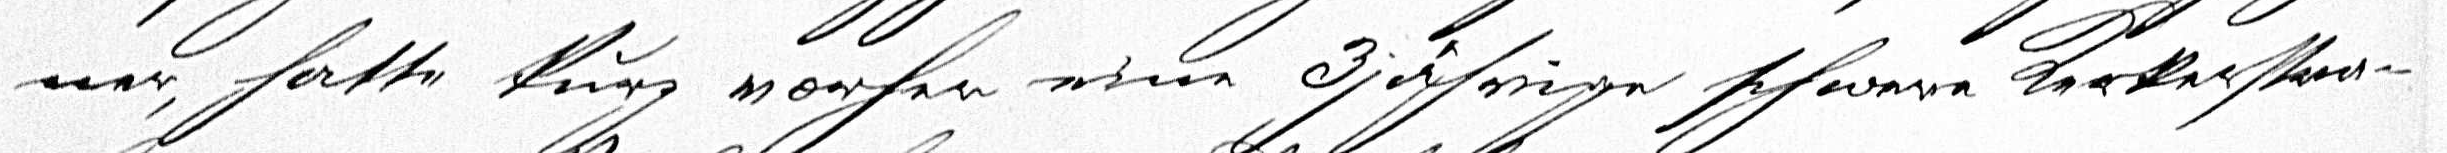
ner, hatte kurz vorher eine 3jährige schwere Kerkerstra¬
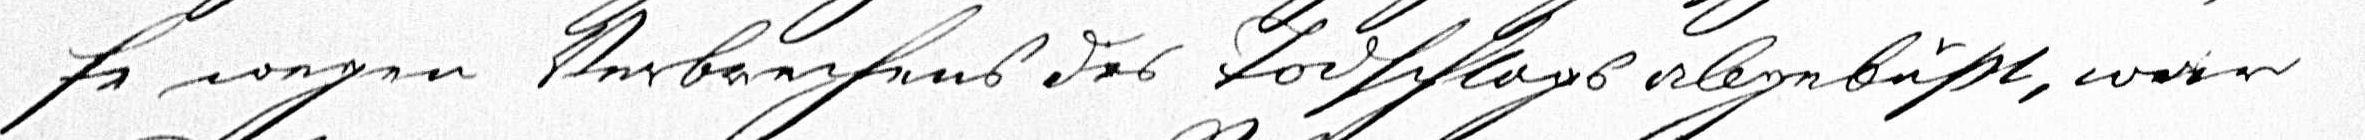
fe wegen Verbrechens des Todschlags abgebußt, war
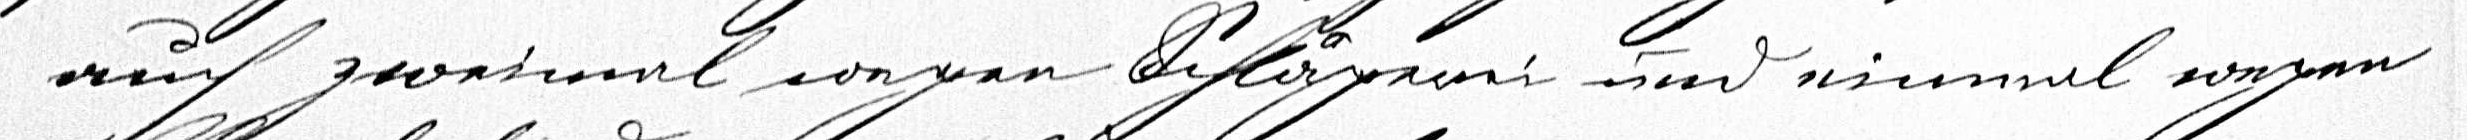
auch zweimal wegen Schlägerei und einmal wegen
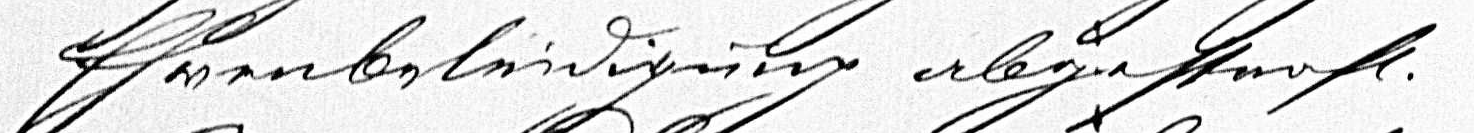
Ehrenbeleidigung abgestraft.
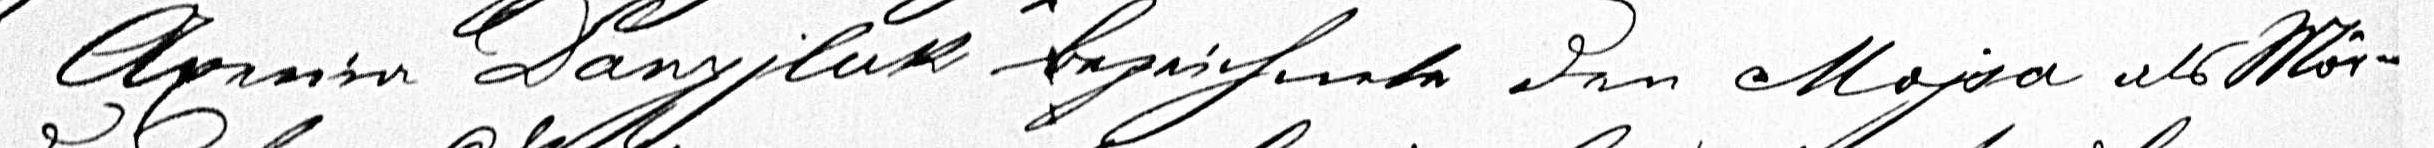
Axenia Danyjluk bezeichnete den Mojsa als Mör¬
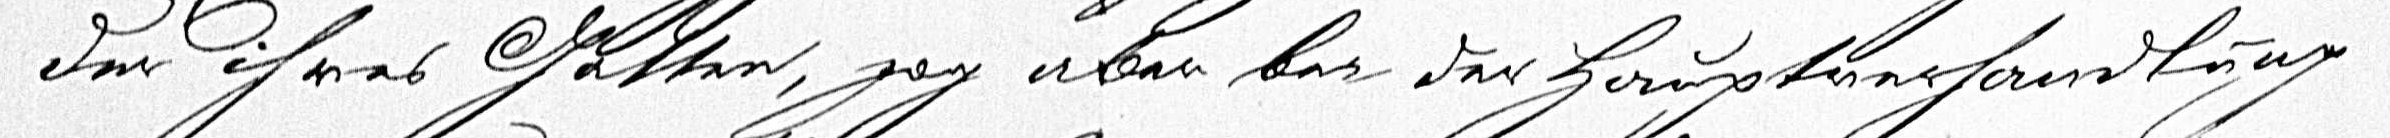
der ihres Gatten, zog aber bei der Hauptverhandlung
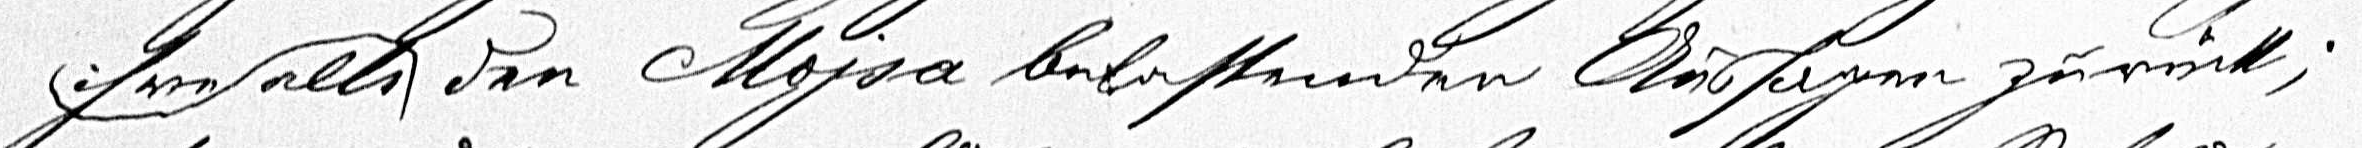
alle ihre den Mojsa belastenden Aussagen zurück;
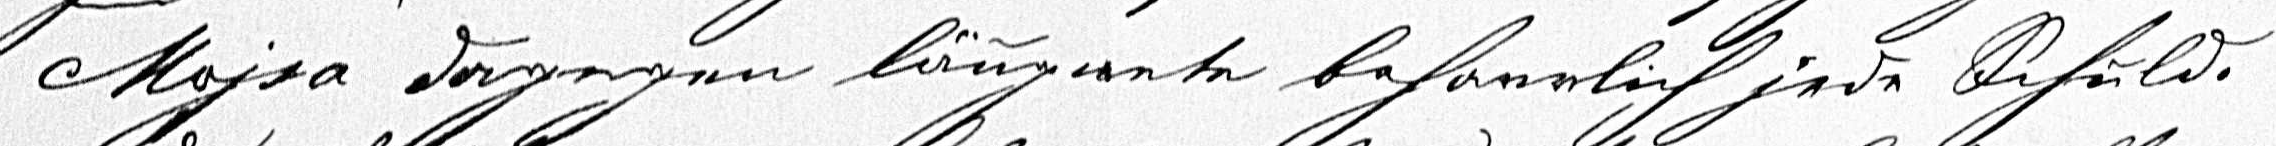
Mojsa dagegen läugnete beharrliche jede Schuld.
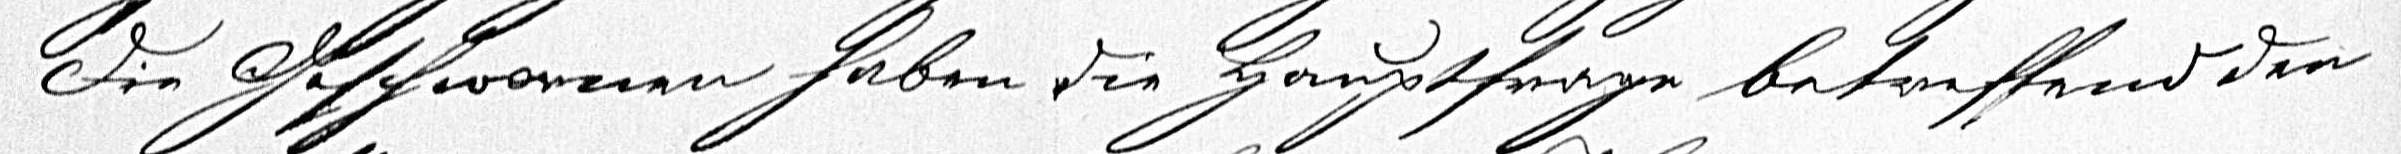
Die Geschworene haben die Hauptfrage betreffend den
